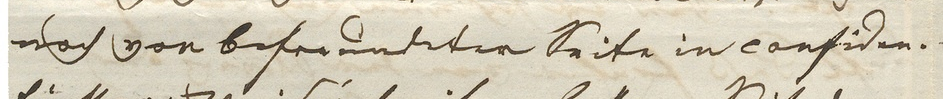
noch von befreundeter Seite in confiden-
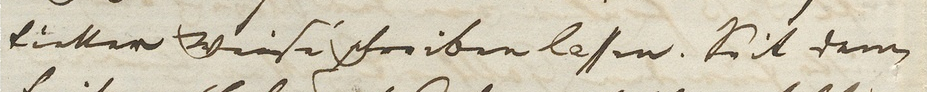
tieller Weise schreiben lassen. Seit dem
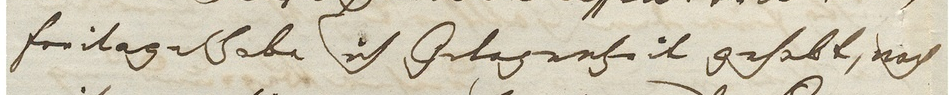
Freitage habe ich Gelegenheit gehabt, noch
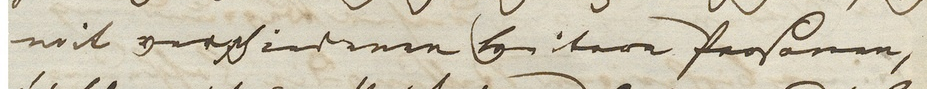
mit verschiedenen weitern Personen,
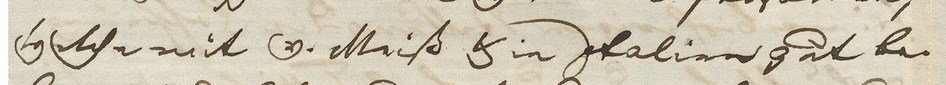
welche mit v. Meiß & in Italien gut be-
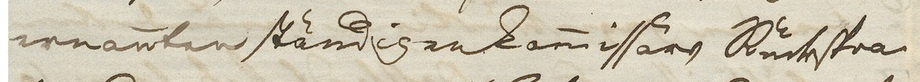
ernannten ständigen Kommissärs Rückspra-
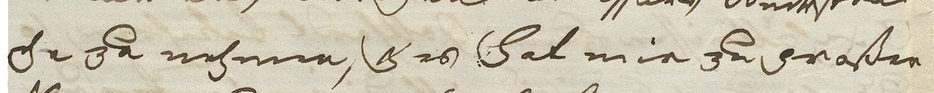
che zu nehmen, & es hat mir zu großer
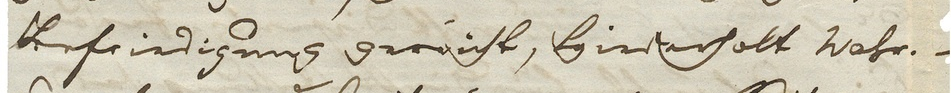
Befriedigung gereicht, wiederholt wahr-
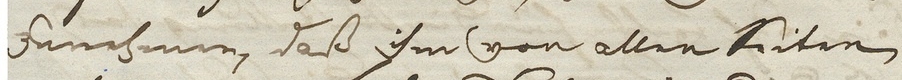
zunehmen, daß ihm von allen Seiten
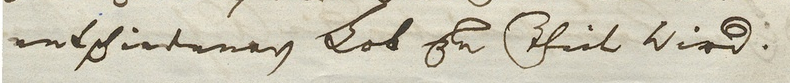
entschiedenes Lob zu Theil wird.
